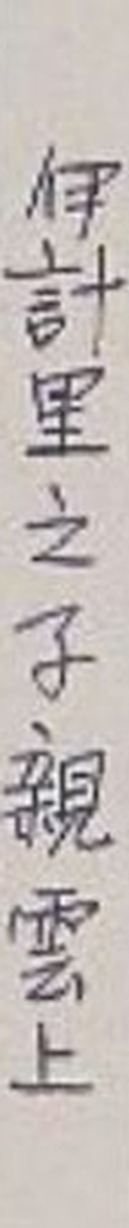同伊計里之子親雲上
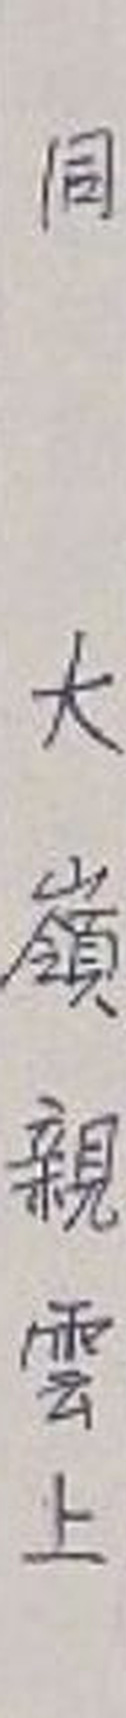同大嶺親雲上
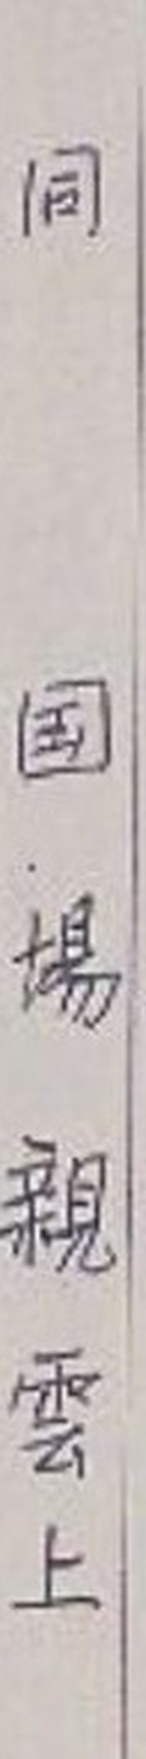同国場親雲上
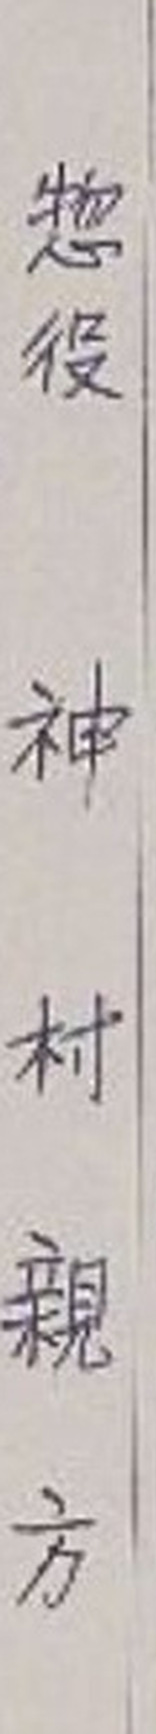惣役神村親方
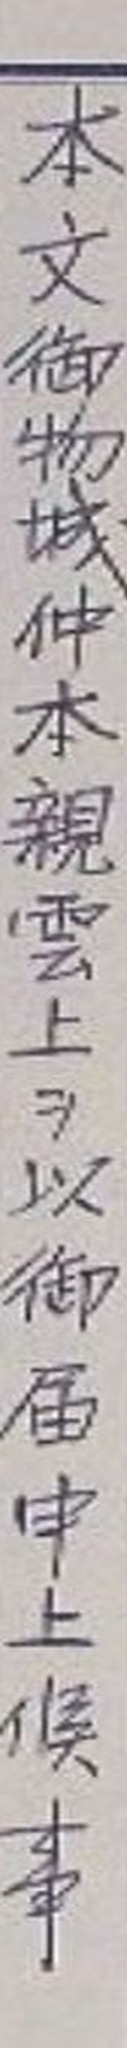本文御物城仲本親雲上を以御届申上候事
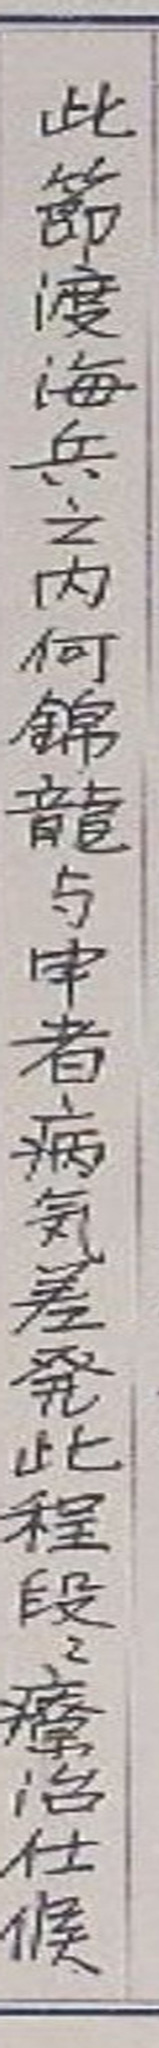此節渡海兵之内何錦龍と申者病気差発此程段々療治仕候

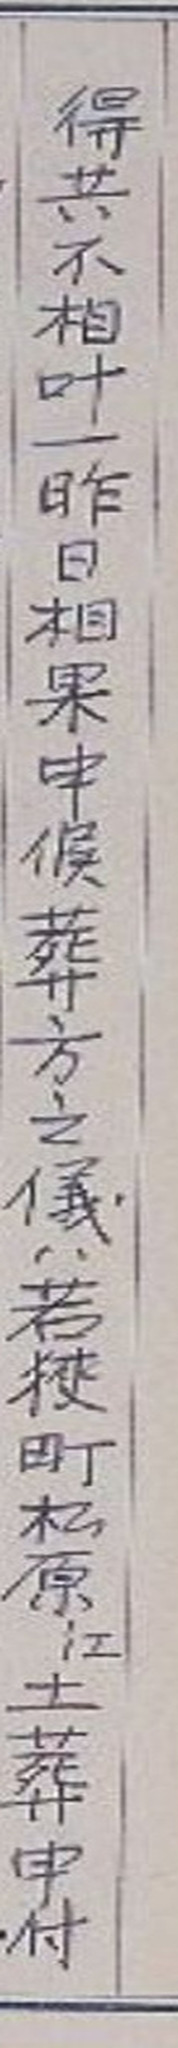得共不相叶一昨日相果申候葬方之儀は若狭町松原え土葬申付
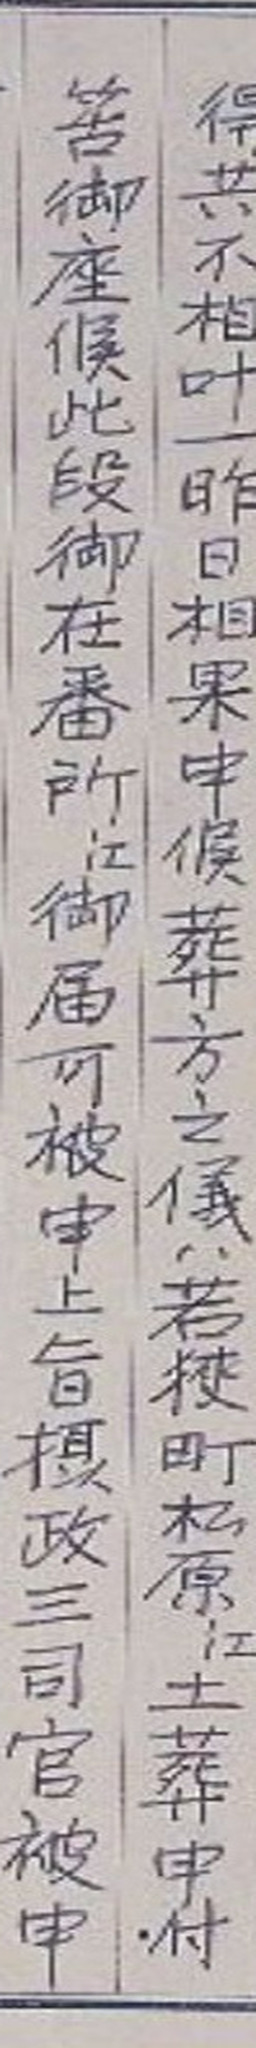筈御座候此段御在番所え御届可被申上旨摂政三司官被申
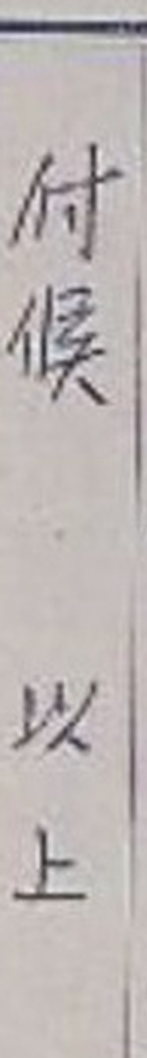付候以上
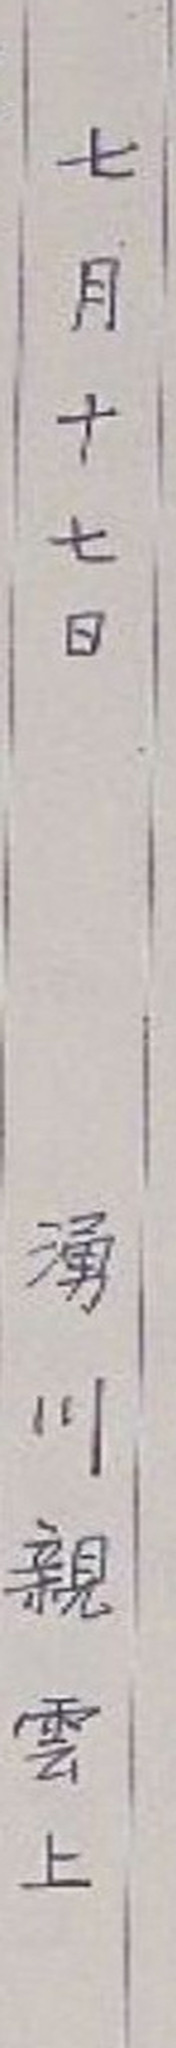七月十七日湧川親雲上
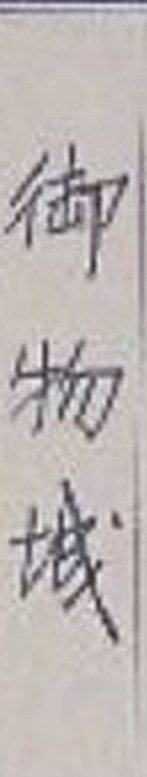御物城
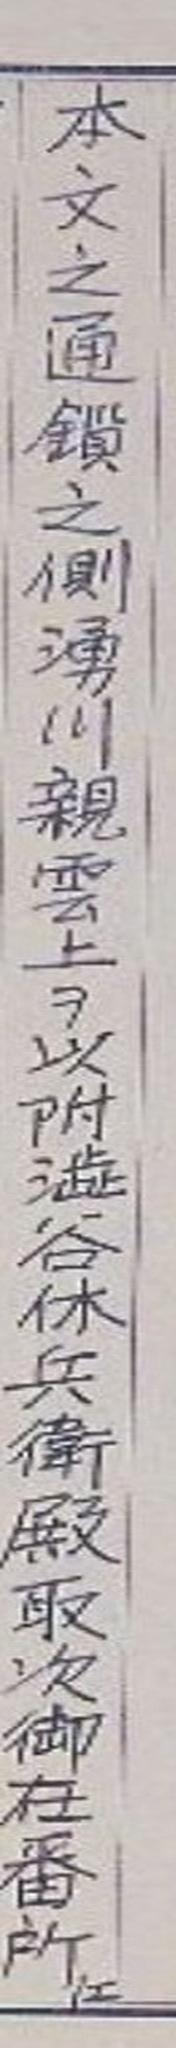本文之通鎖之側湧川親雲上を以附渋休兵衛殿取次御在番所え
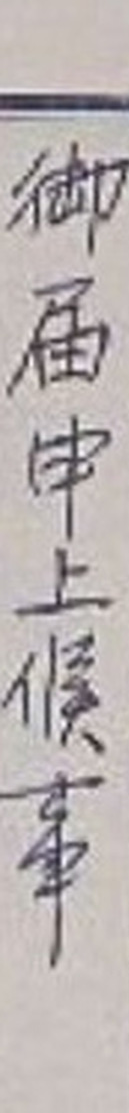御届申上候事
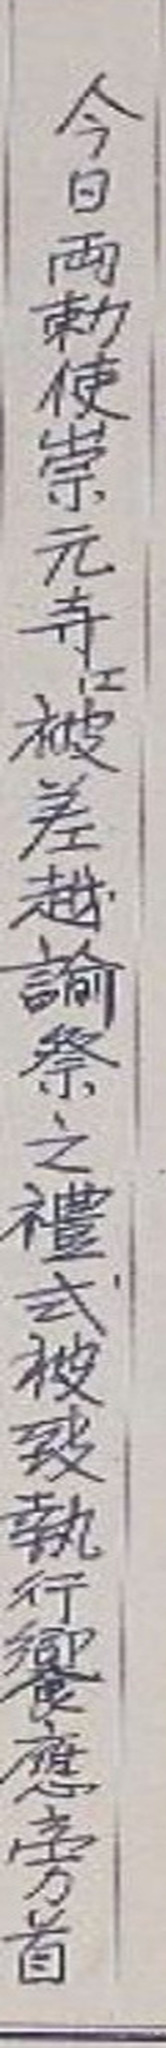今日両勅使崇元寺え被差越諭祭之礼式被致執行饗応旁首
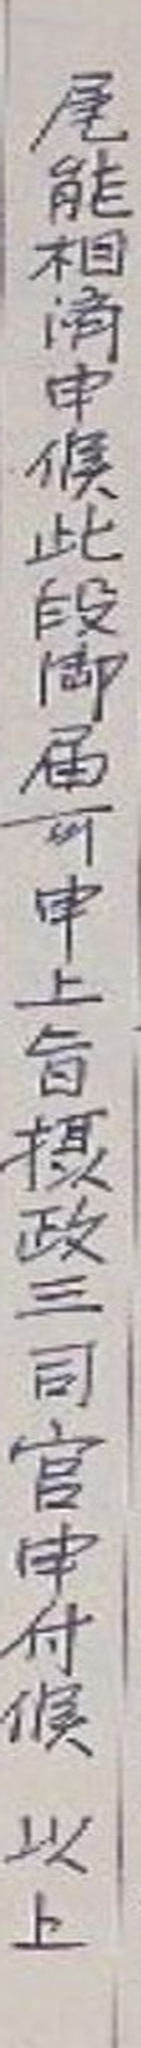尾能相済申候此段御届可申上旨摂政三司官申付候以上
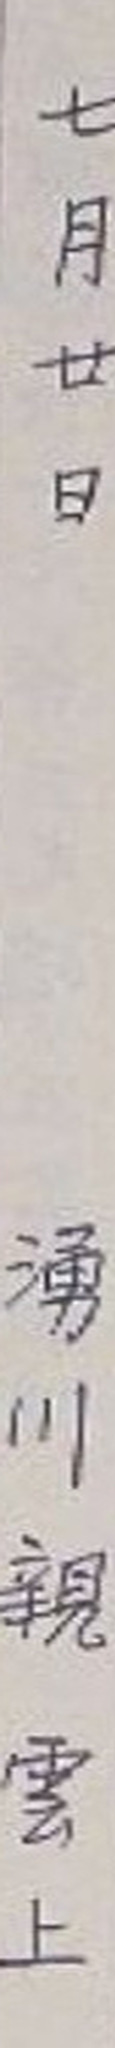七月廿日湧川親雲上
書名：支那冊封使来琉諸記 下巻
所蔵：University of the Ryukyus Library
